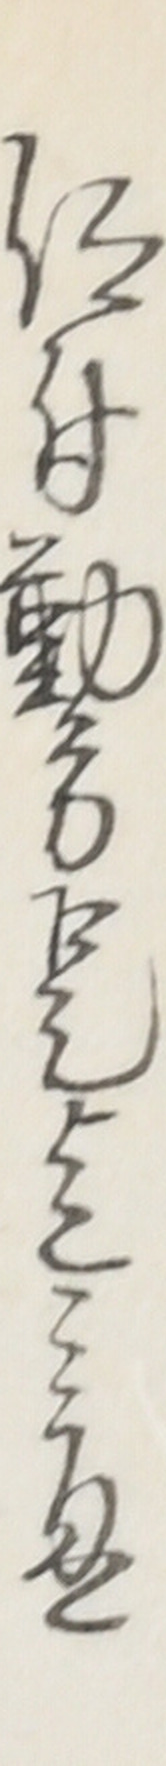仰付勤方是迄之通
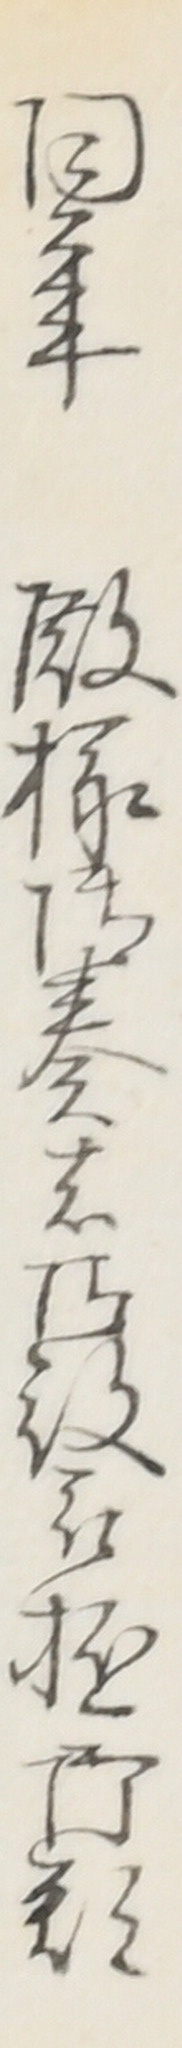一同年殿様御奏者御役被遊御願
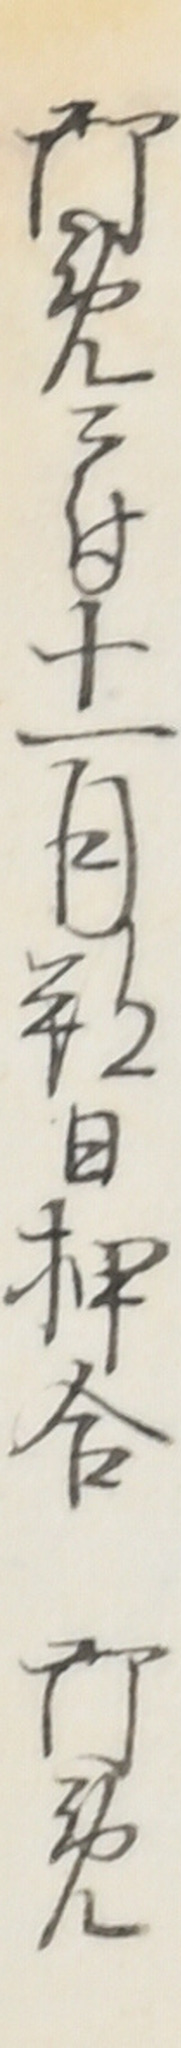御免ニ付十一月朔日押合御免
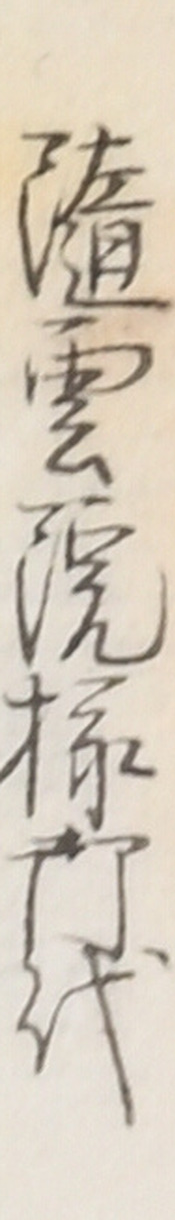隨雲院様御代
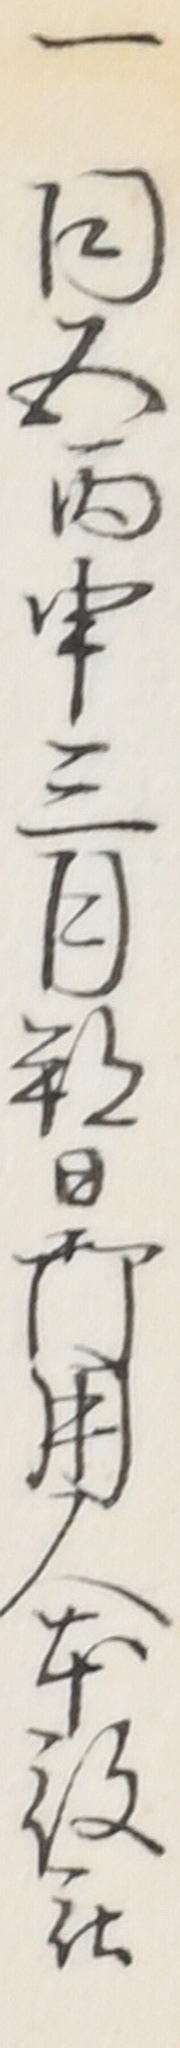一同五丙申三月朔日御用人本役被
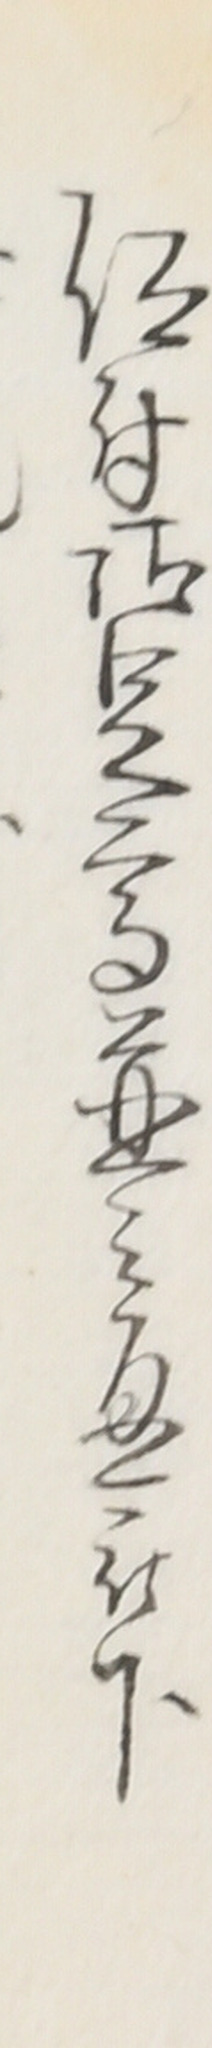仰付御足高並之通被成下
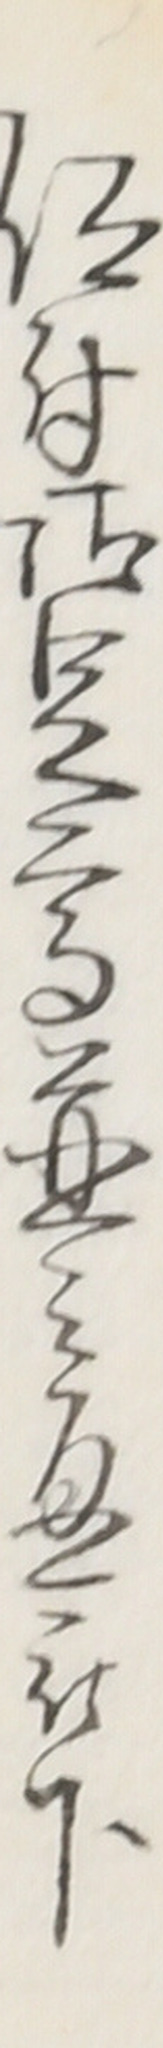仰付御足高並之通被成下
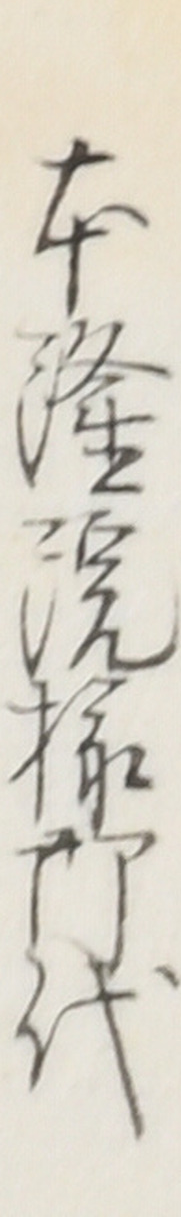本隆院様御代
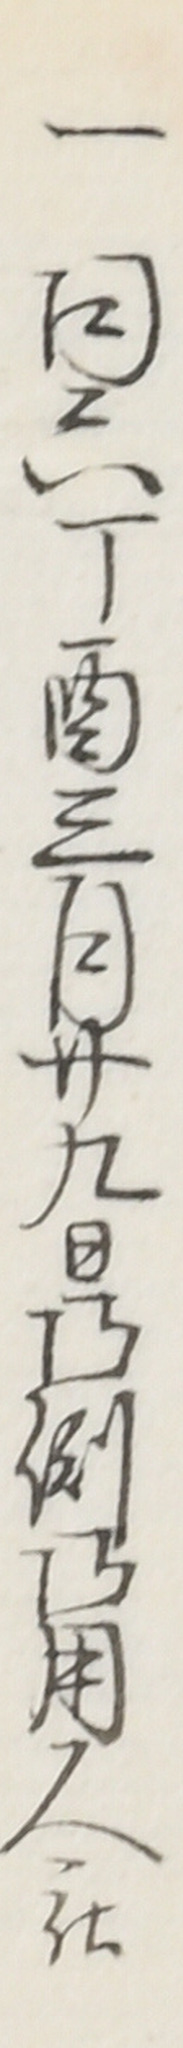一同六丁酉三月廿九日御側御用人被
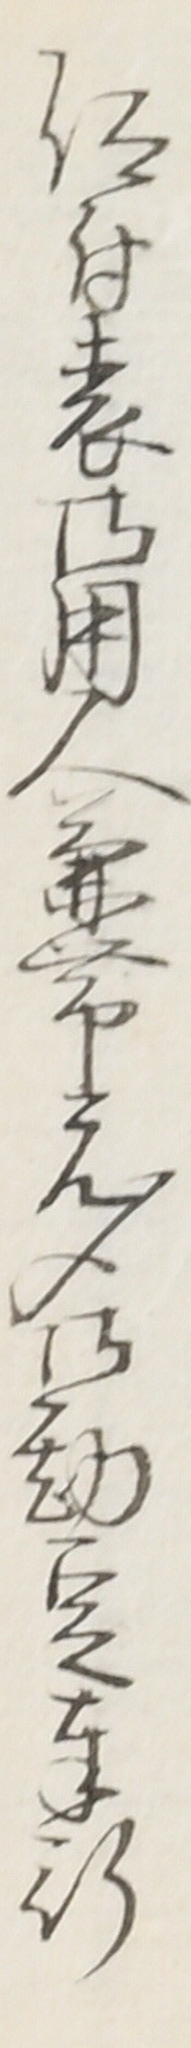仰付表御用人兼帯元〆御勘定奉行
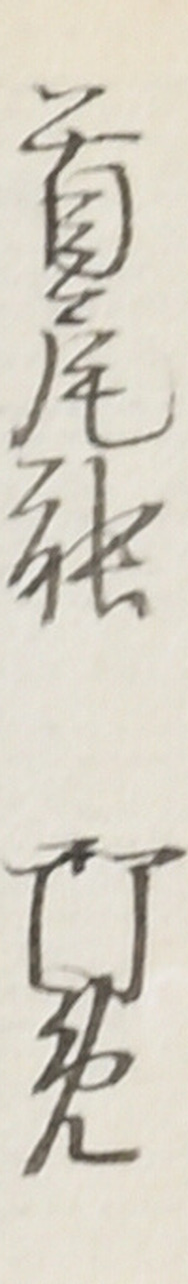首尾能御免
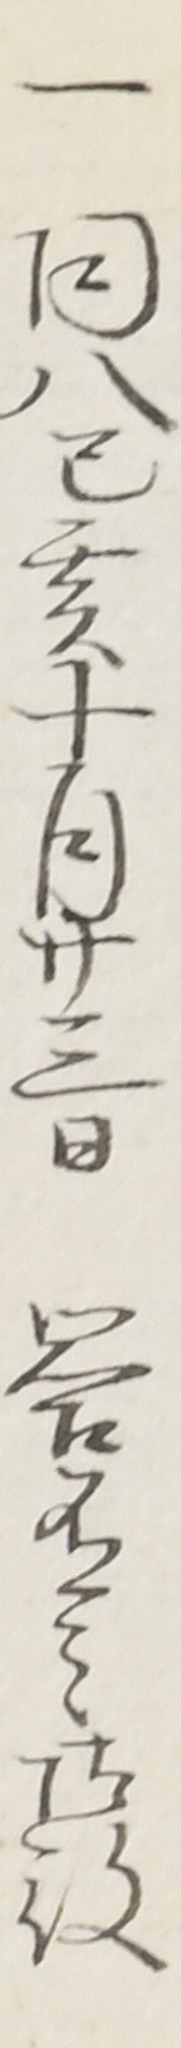一同八己亥十月廿三日思召有之御役
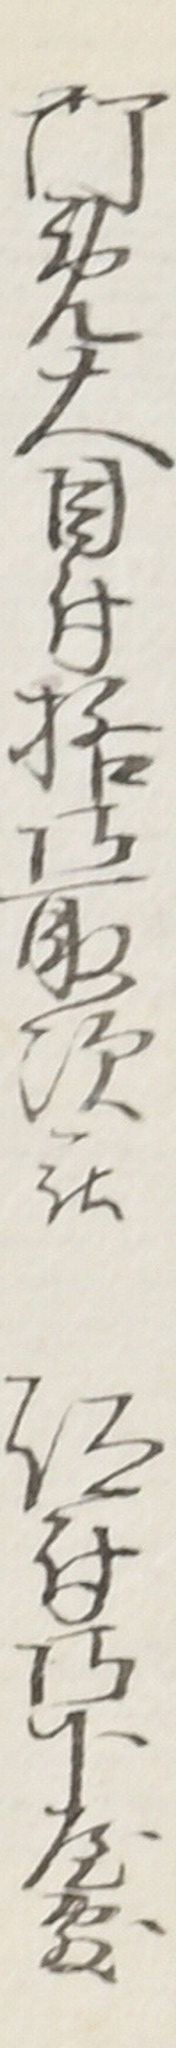御免大目付格御取次被仰付御下屋敷
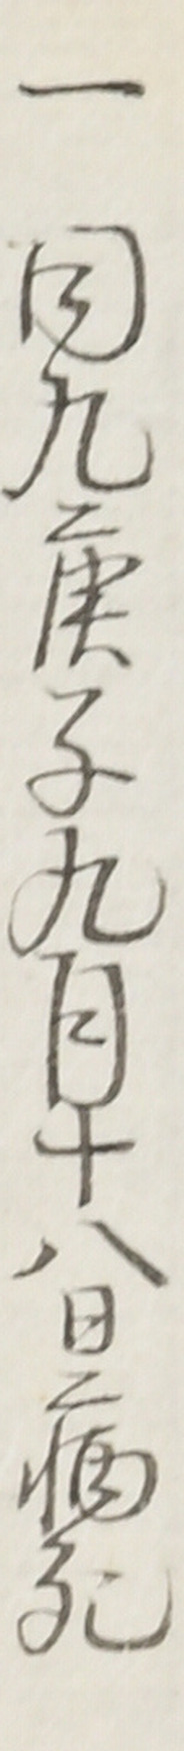一同九庚子九月十八日病死
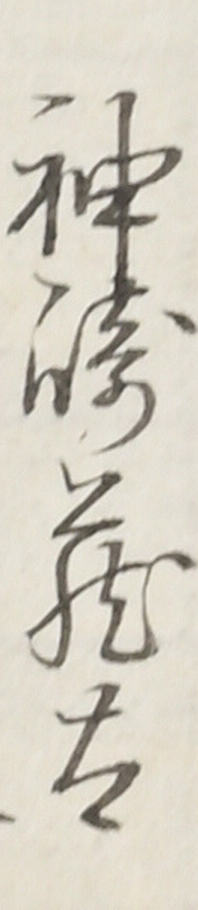神崎蔵太
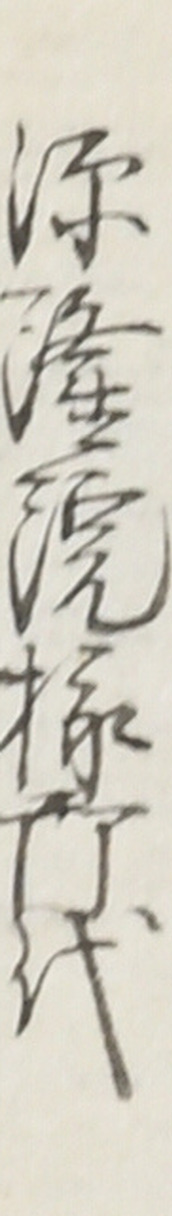源隆院様御代
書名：給人諸士勤仕録（七）
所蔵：伊那市立高遠町図書館・合同会社AMANE
